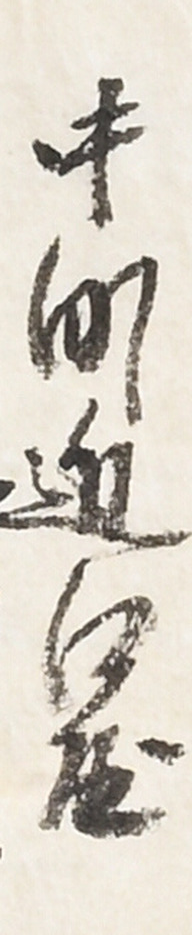中町近江屋
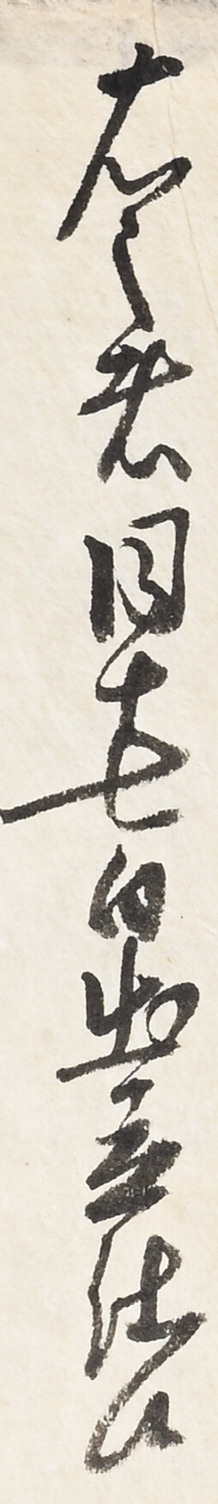右之者同十七日出立仕候
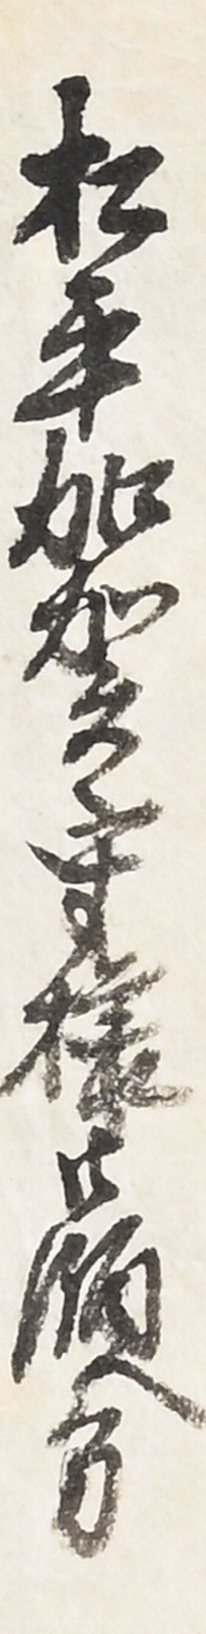松平加賀守様御領分
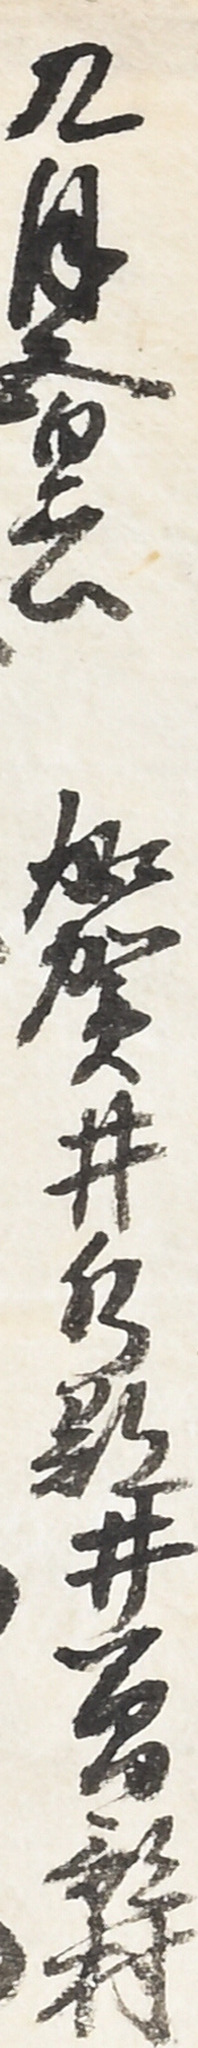九月五日着加賀井水郡井曽部村
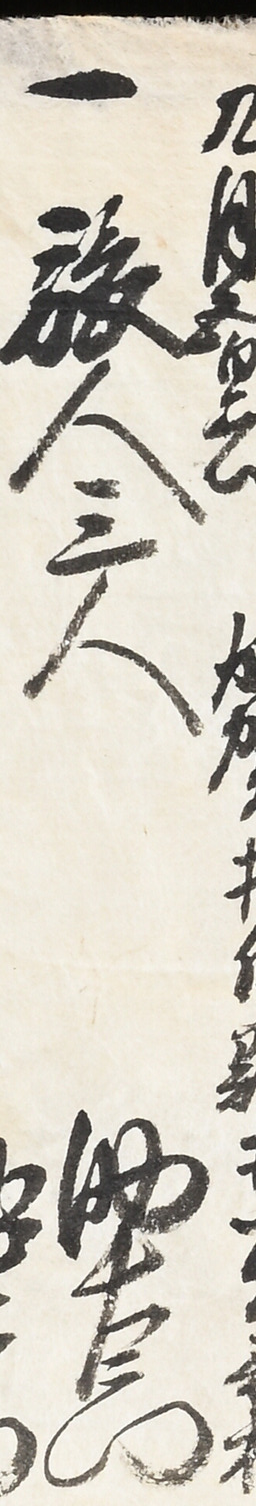一旅人三人助右衛門
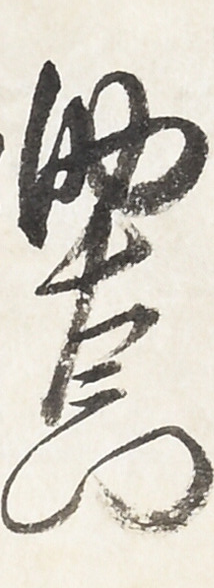作右衛門
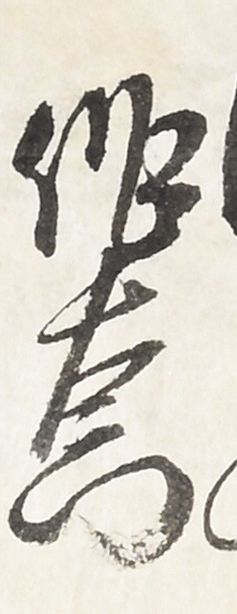作右衛門
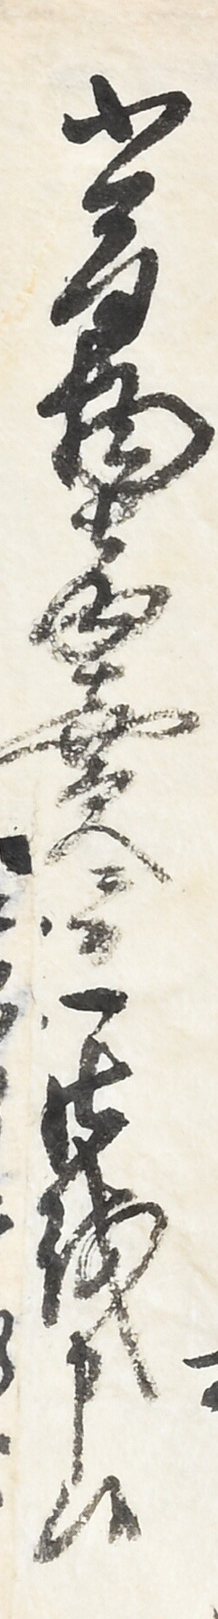小間物商売ニ而罷越申候
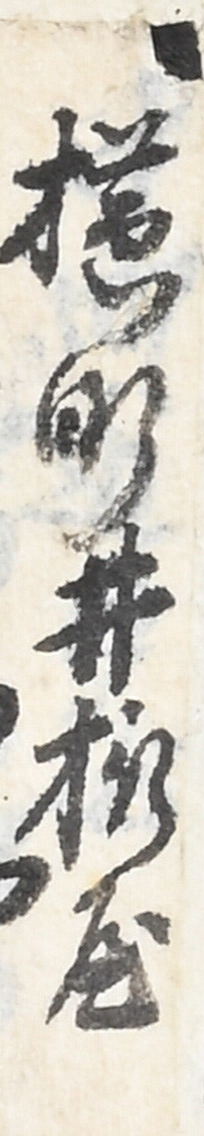横町井桁屋
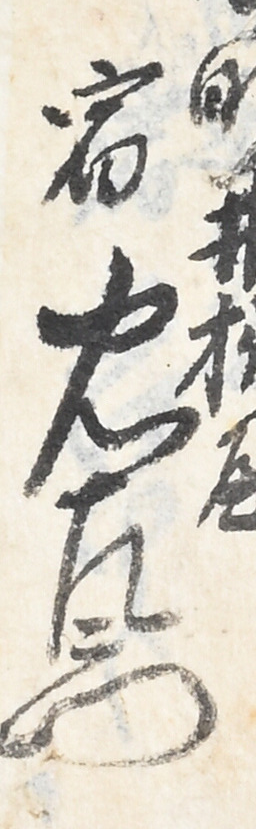宿忠左衛門
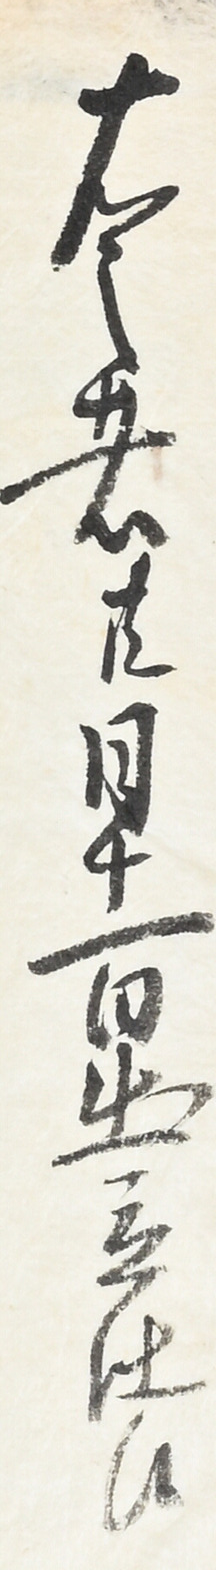右之者共同十一日出立仕候
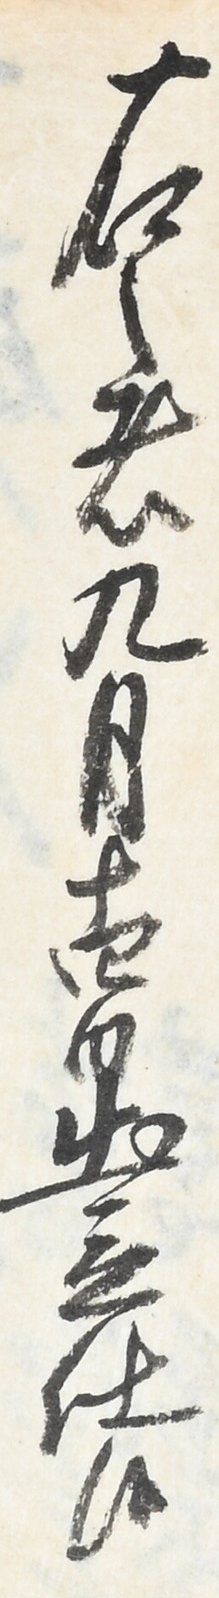右之者同十七日出立仕候

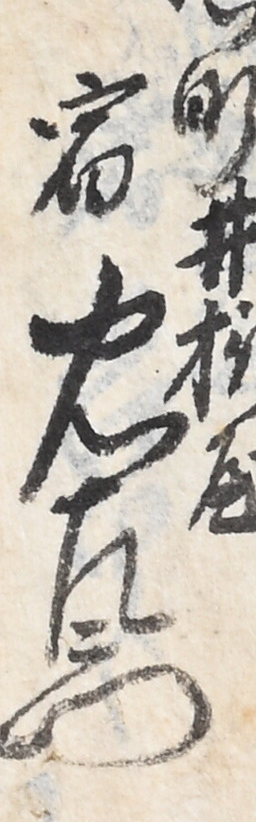宿吉左衛門
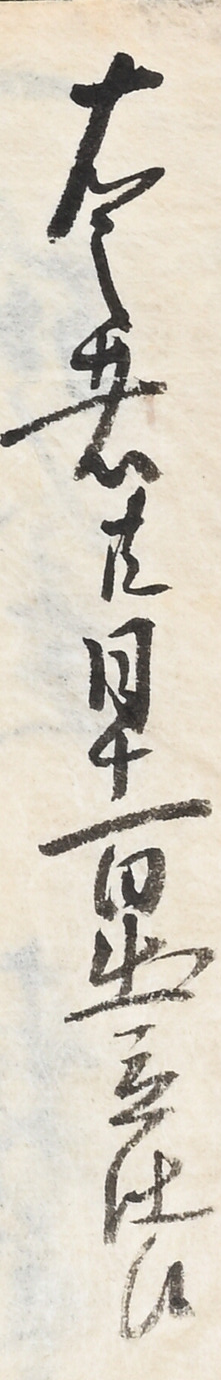右之者九月十四日出立仕候
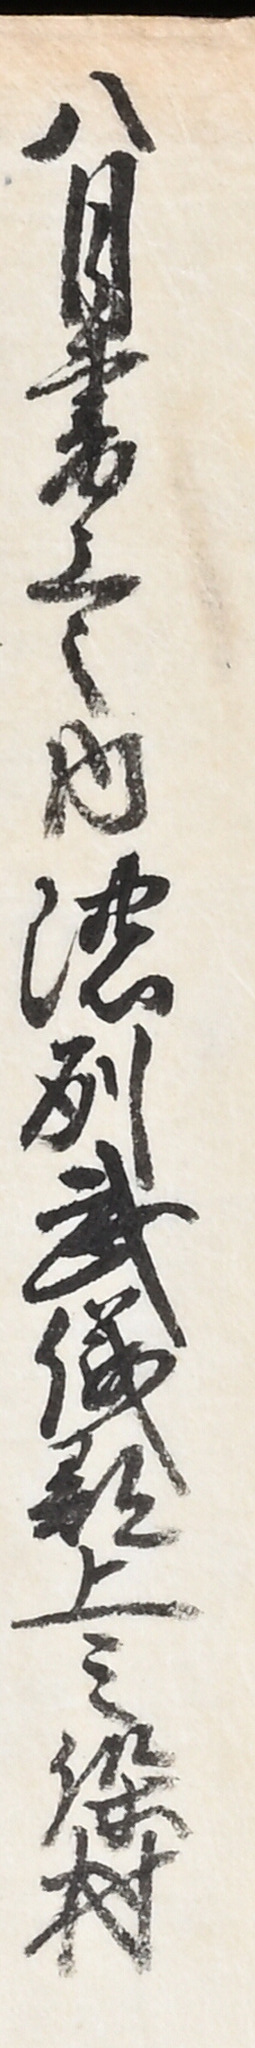八月書上之内濃州武儀郡上之保村
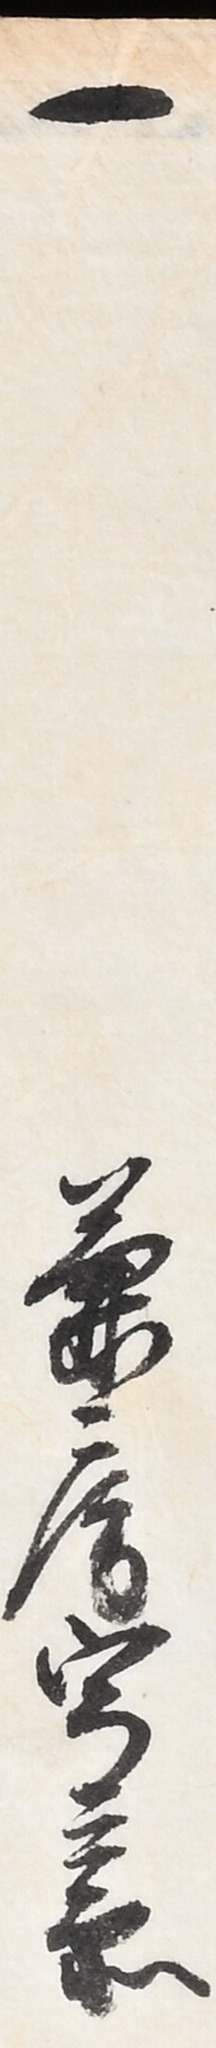一兼房宇兵衛
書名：旅人泊控帳
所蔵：伊那市立高遠町図書館・合同会社AMANE
